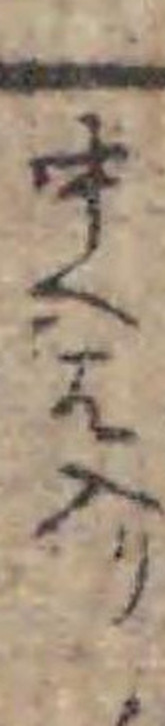中へは入り
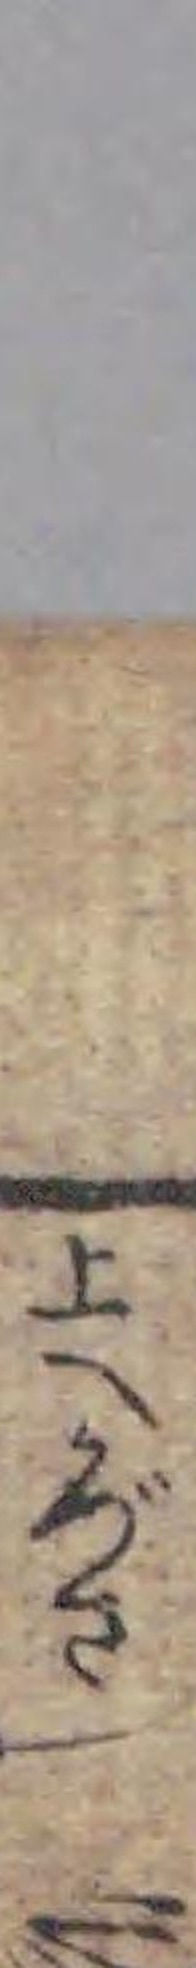上へかづさ
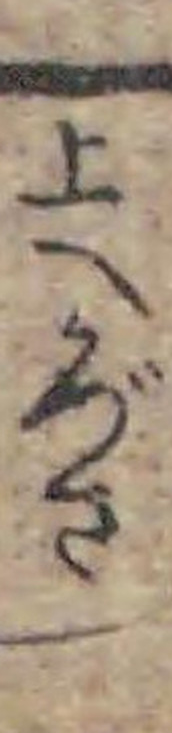上へかづさ
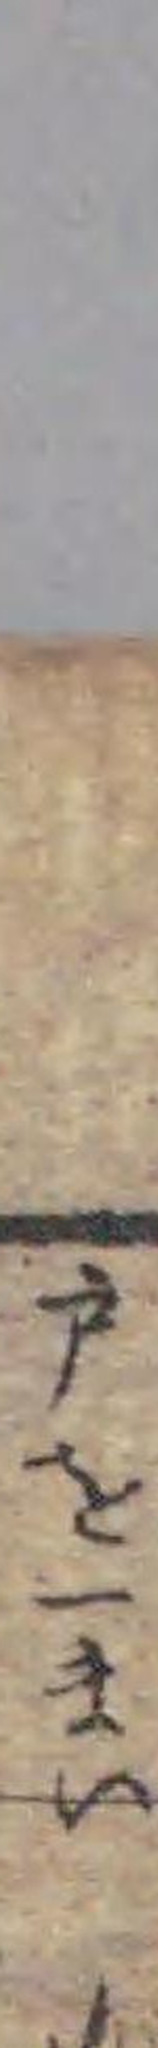戸を一まい
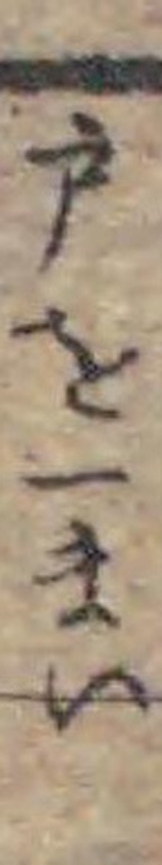戸を一まい
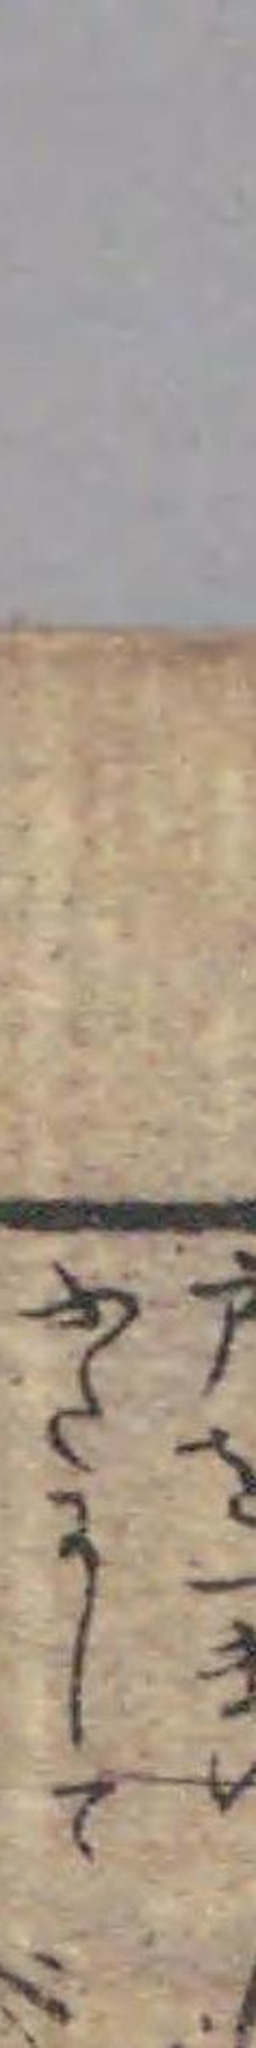ふたにして
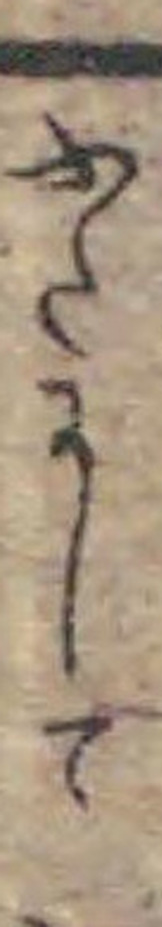ふたにして
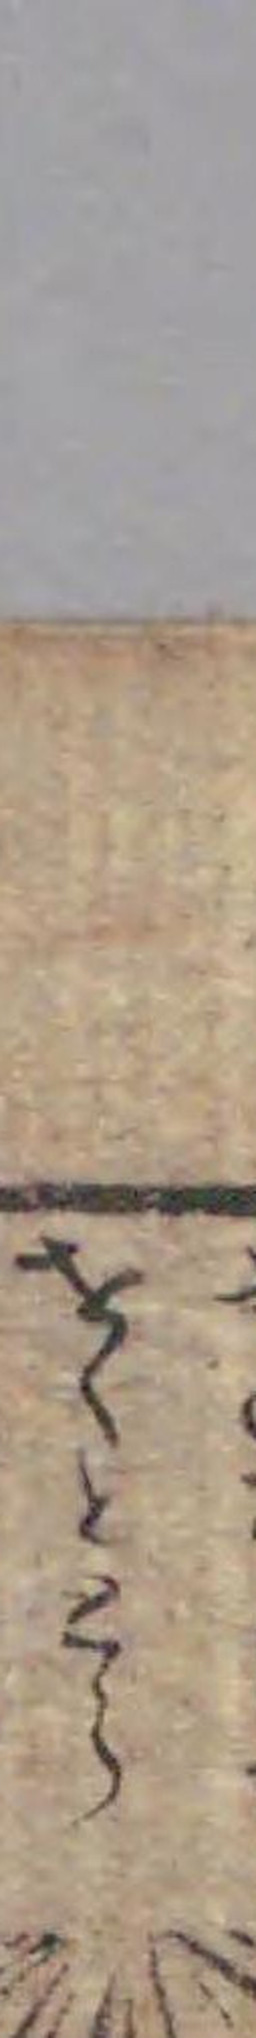をくととら
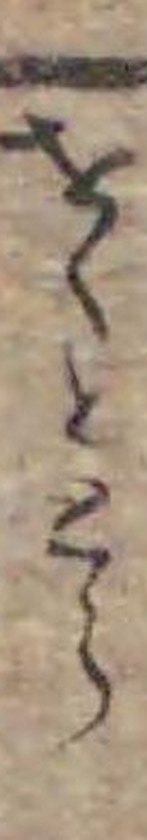をくととら
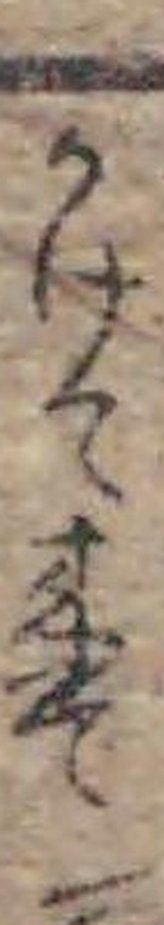かけて来て
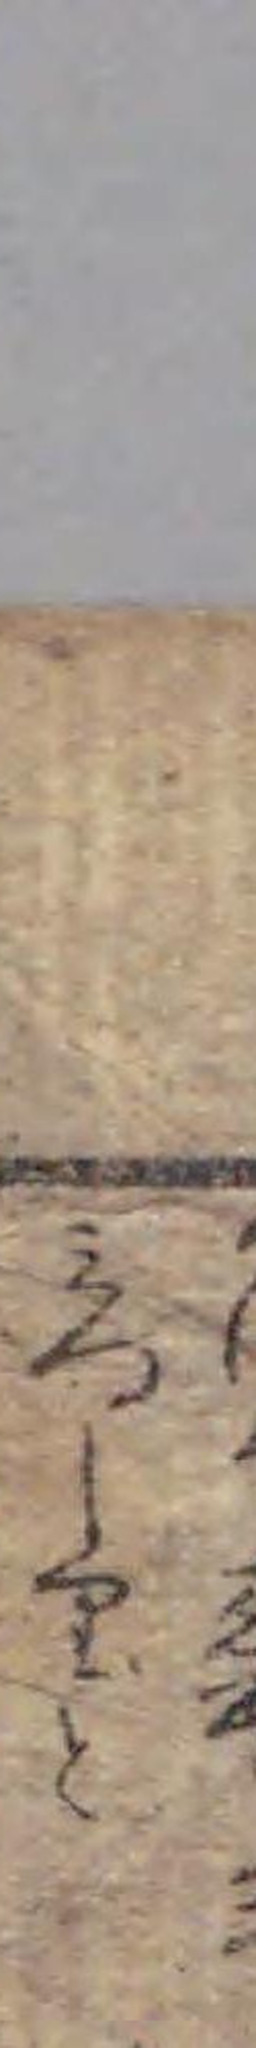みつしりと
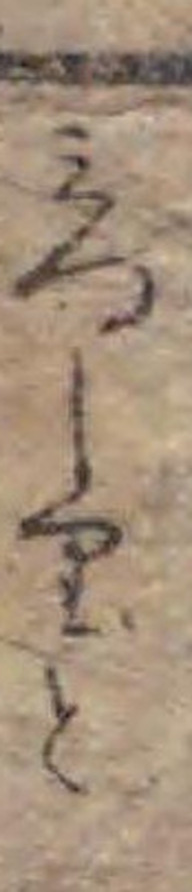みつしりと
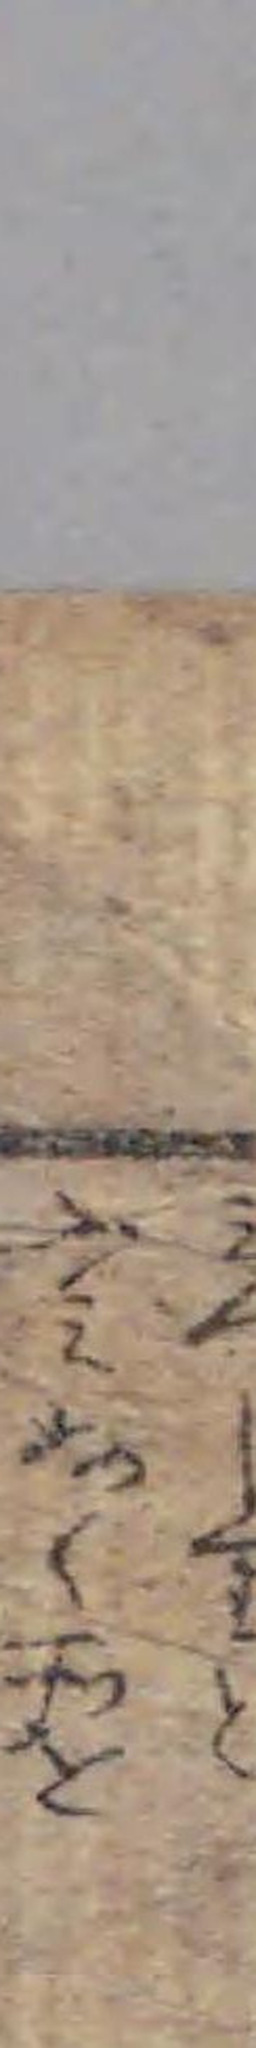ふみぬく所を
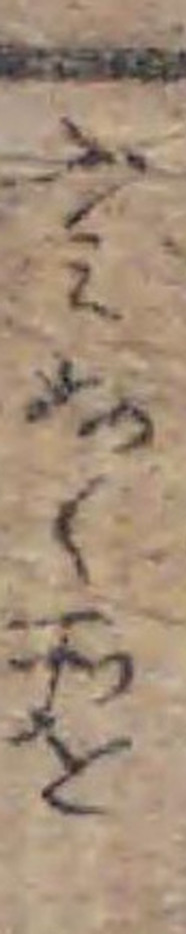ふみぬく所を
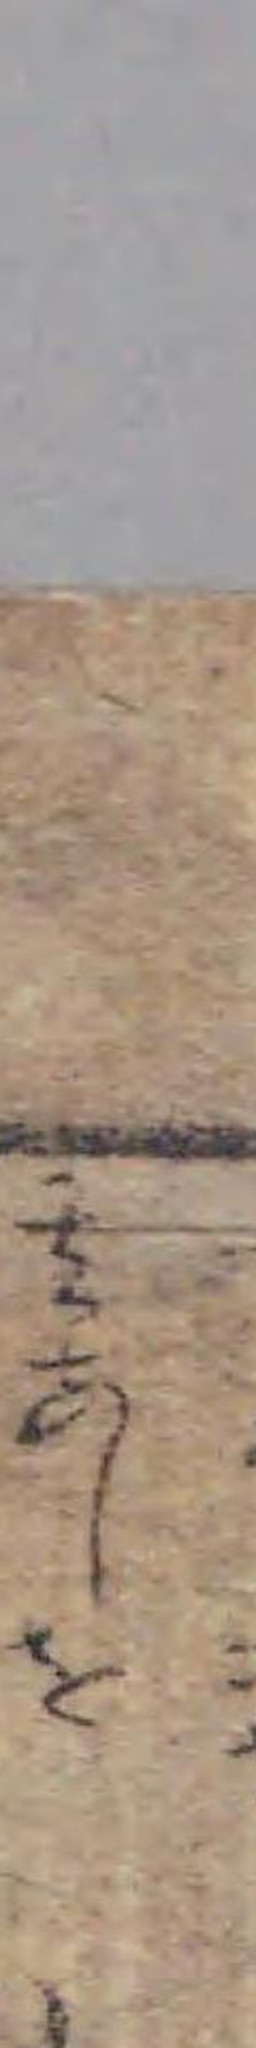其あしを
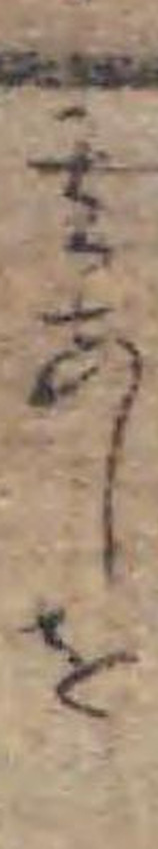其あしを
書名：虚言八百万八伝 : 3巻
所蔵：国立国会図書館 National Diet Library, JAPAN
